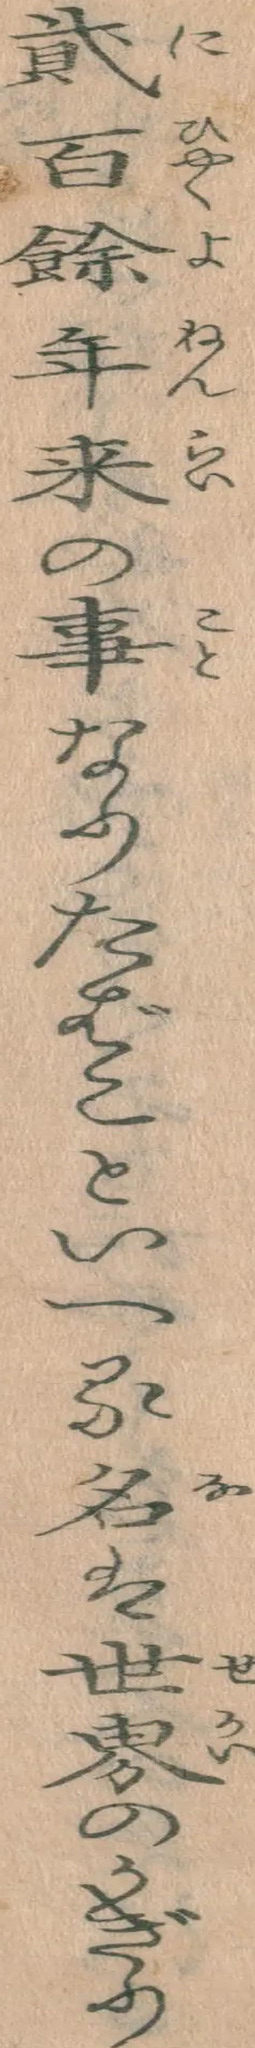弐百余年来の事なりたばこといへる名は世界のかぎり
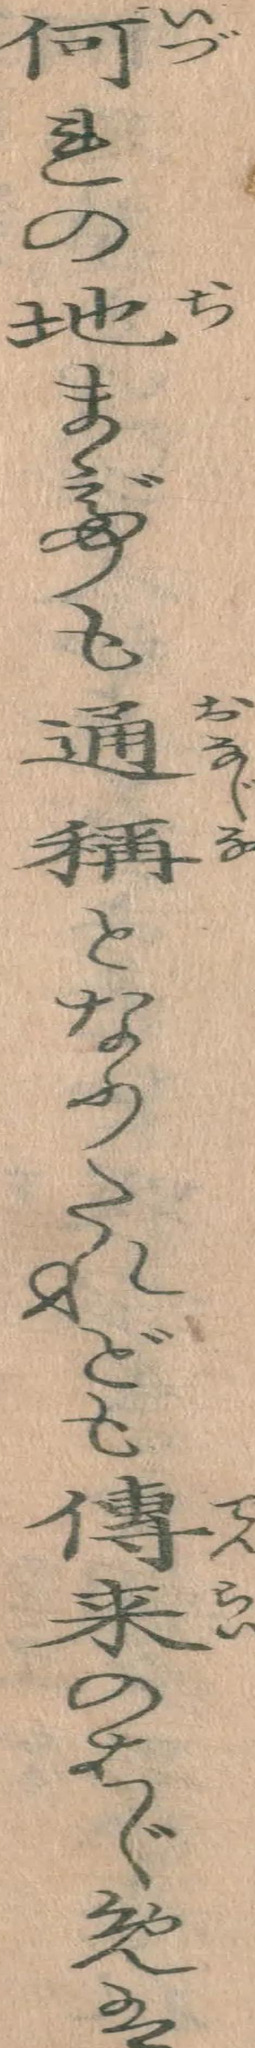何れの地までも通称となりたれども伝来のはじめは
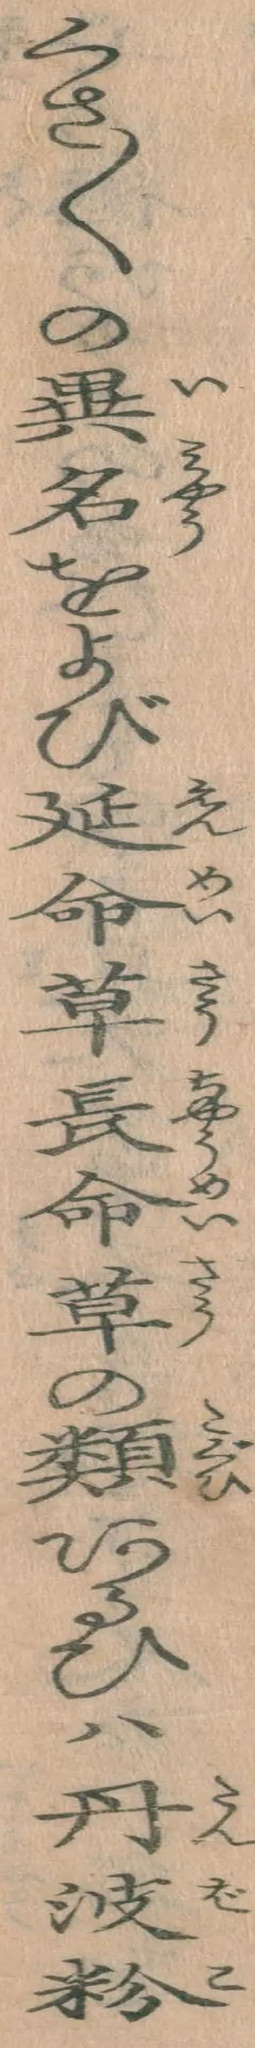くさ〳〵の異名をよび延命草長命草の類あるひは丹波粉
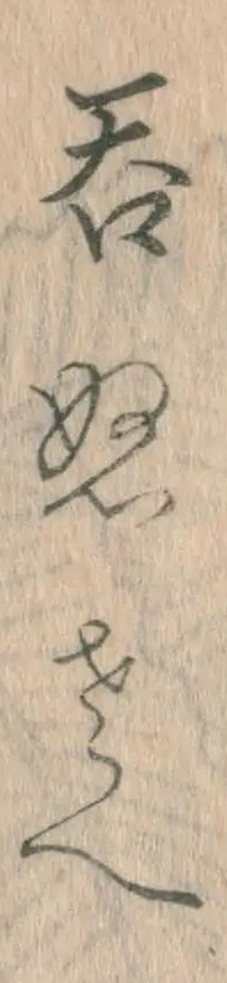呑ぬさへ
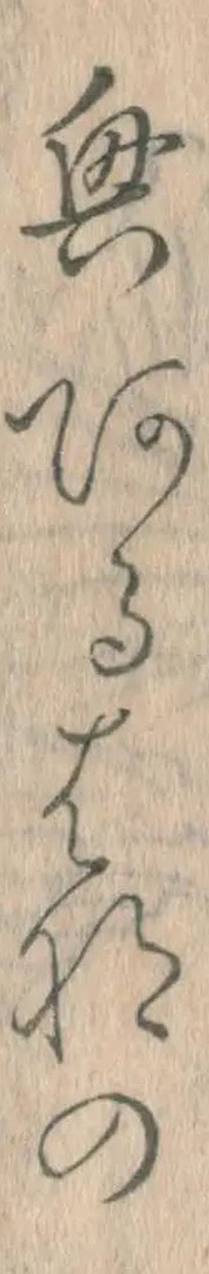興あるはなの
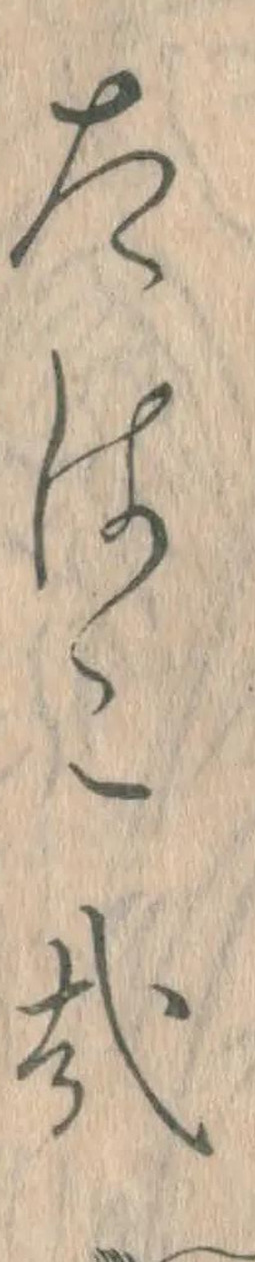たはこ哉

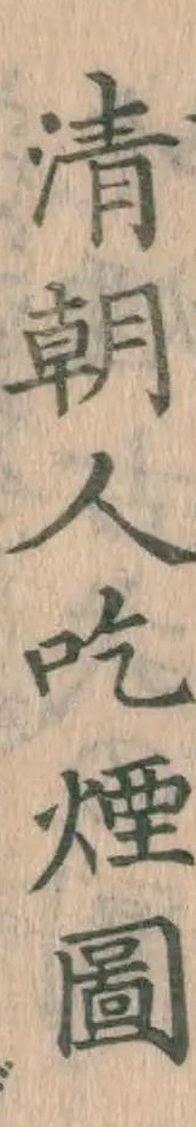清朝人吃煙図
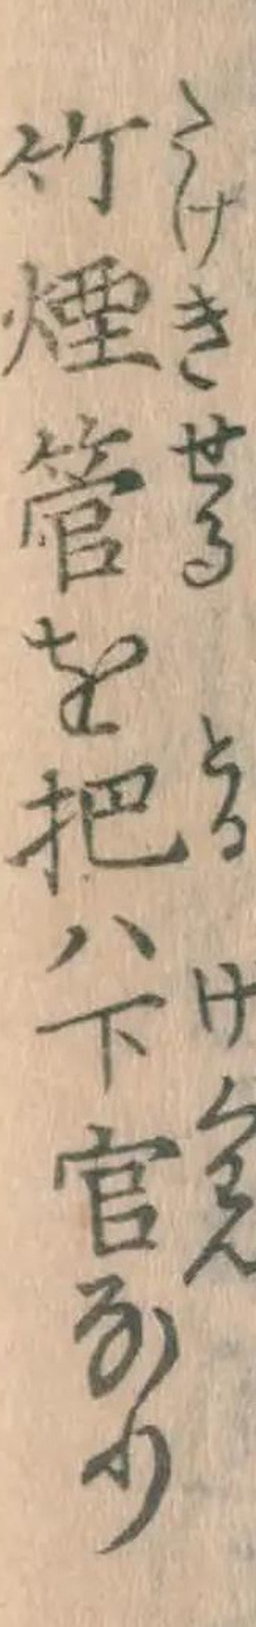竹煙管を把は下官なり

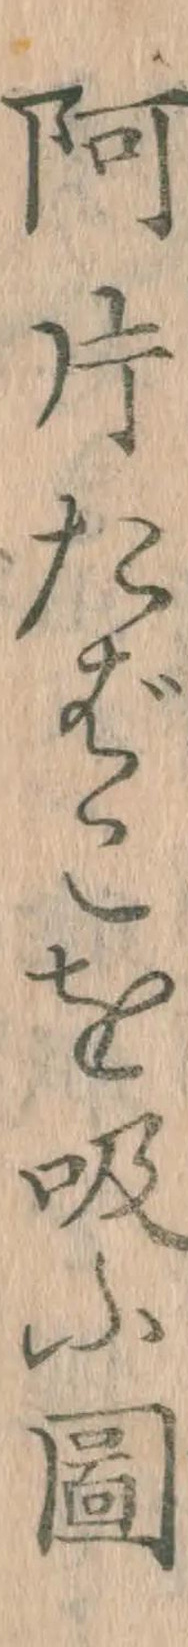阿片たばこを吸ふ図
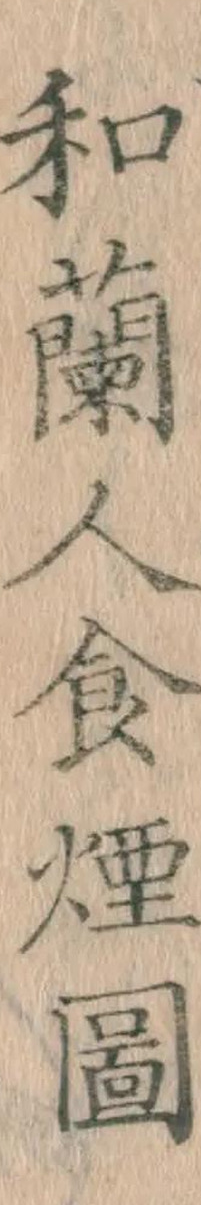和蘭人食煙図

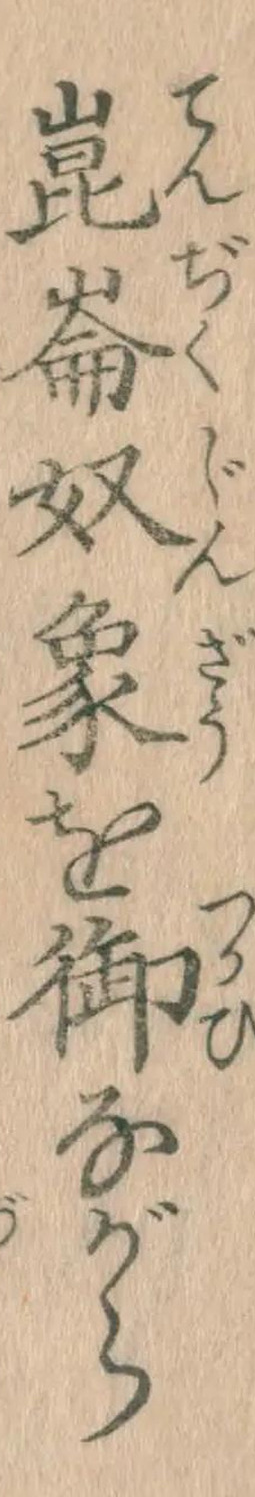崑崙奴象を御ながら
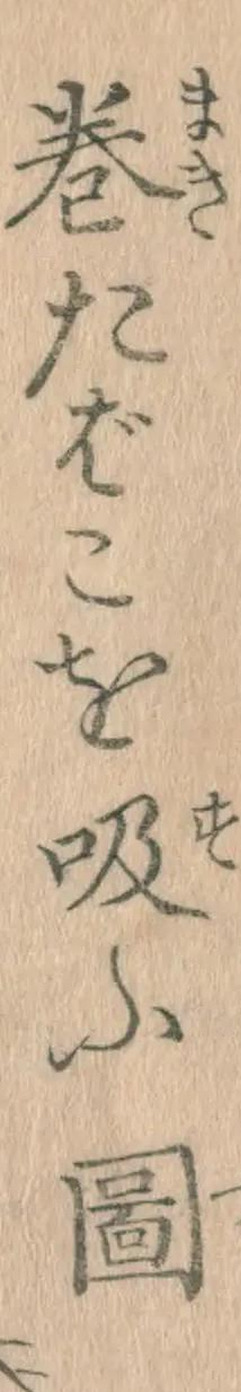巻たばこを吸ふ図
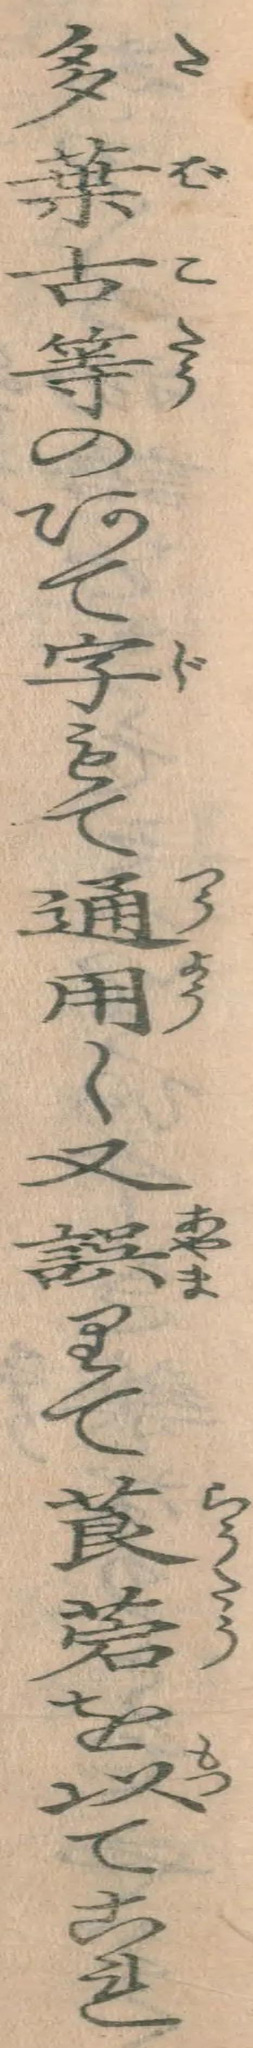多葉古等のあて字もて通用し又誤りて莨菪を以てこれ
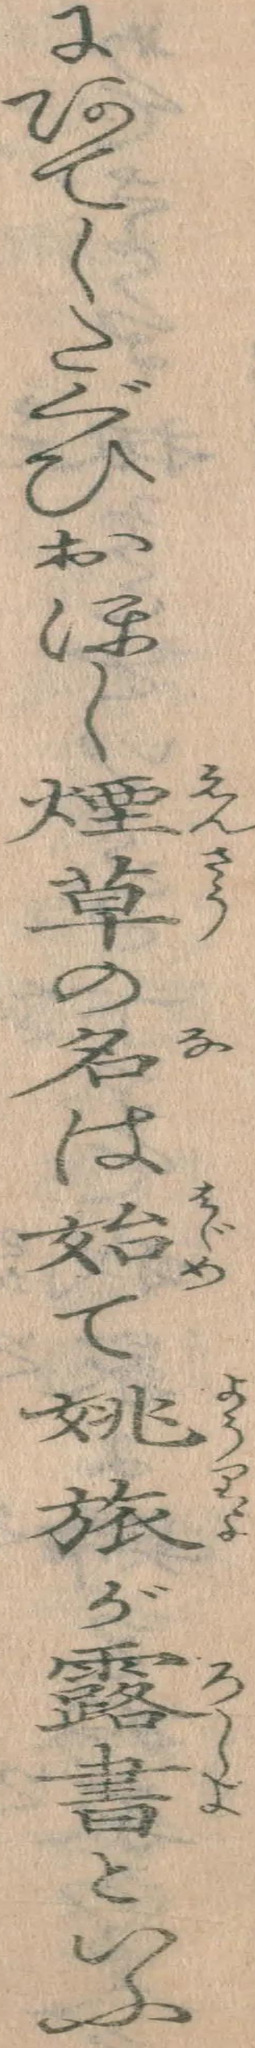にあてしたぐひおほし煙草の名は始て姚旅が露書といふ
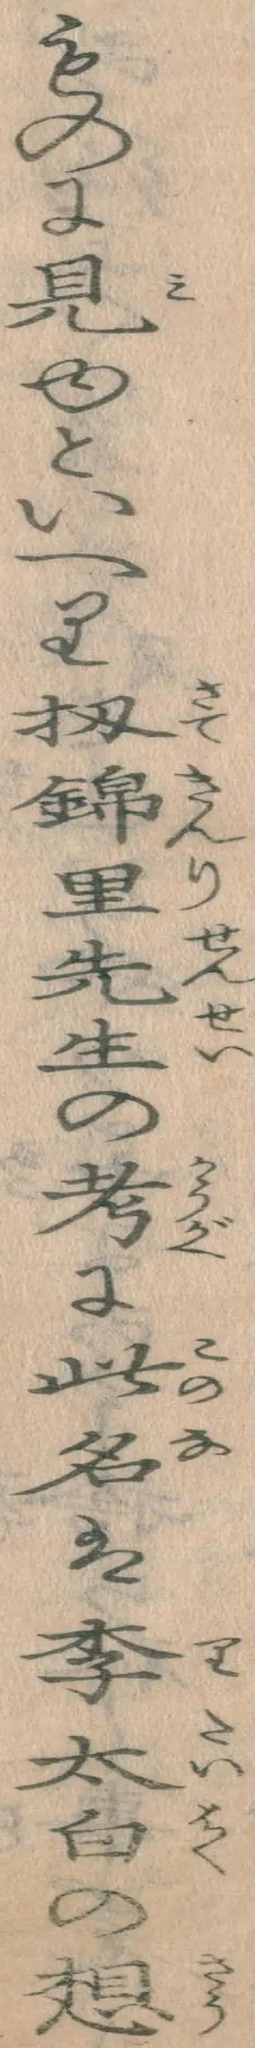ものに見ゆといへり扨錦里先生の考に此名は李太白の想
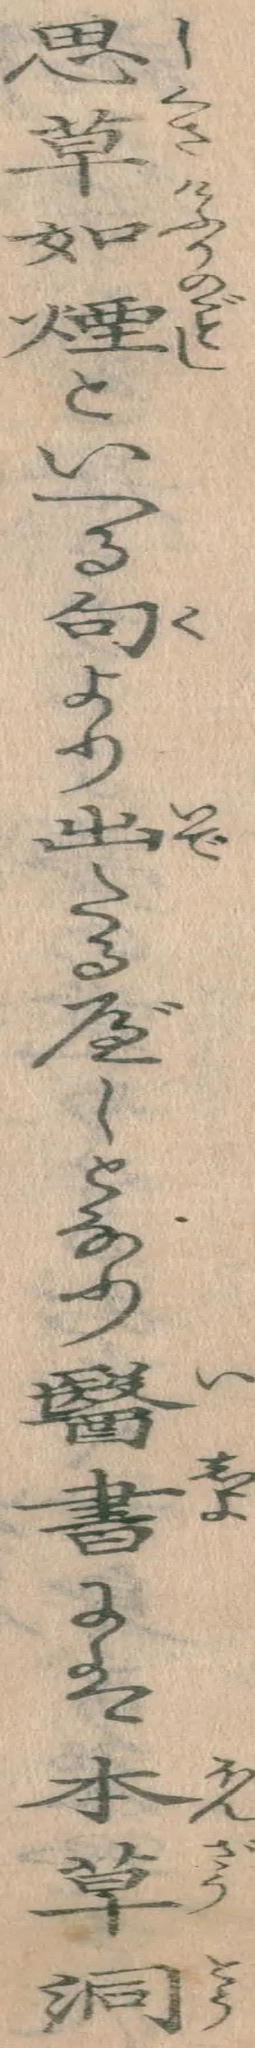思草如煙といへる句より出たるべしとなり医書には本草洞
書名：目さまし草
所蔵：国立国会図書館 National Diet Library, JAPAN
